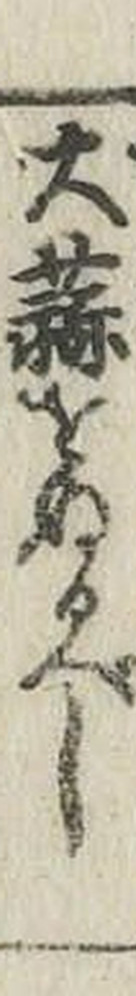大蒜をぬるべし
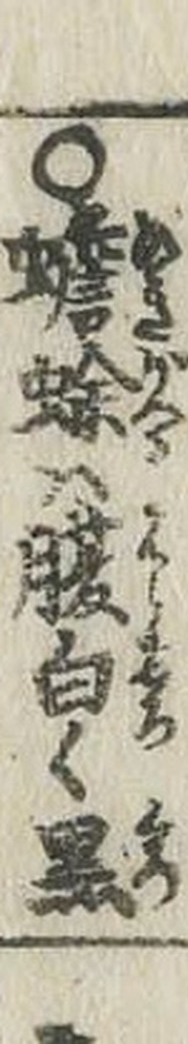○蟾蜍は腹白く黒
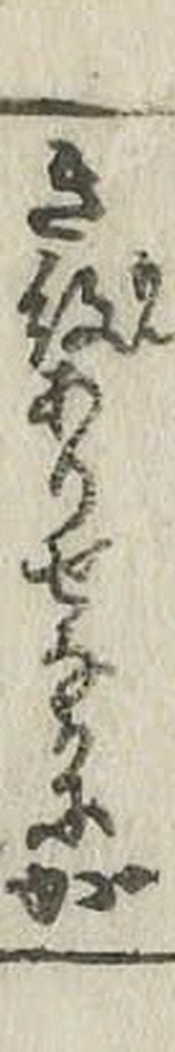き紋ありせなかにが
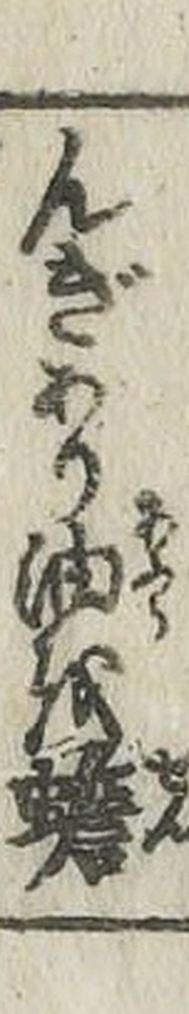んぎあり油を蟾
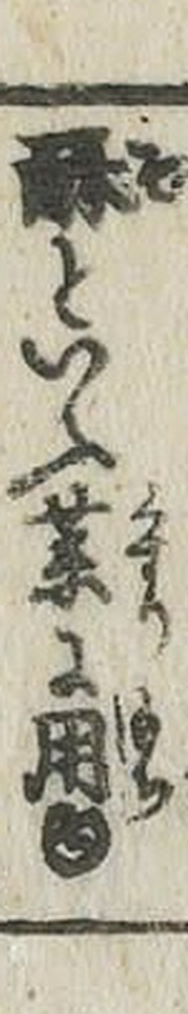酥といふ薬に用ゆ
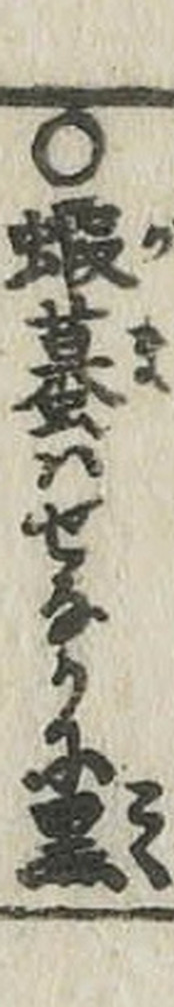○蝦蟇はせなかに黒
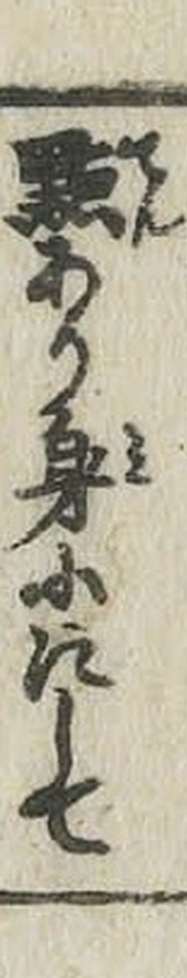点あり身小にして
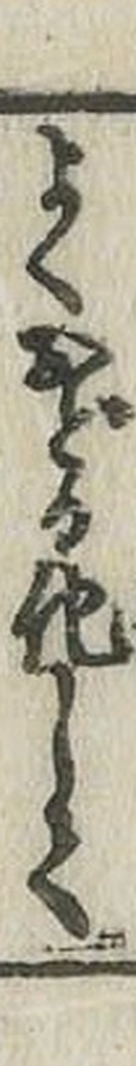よくおどる化して
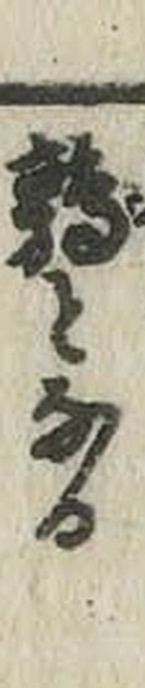鶉となる

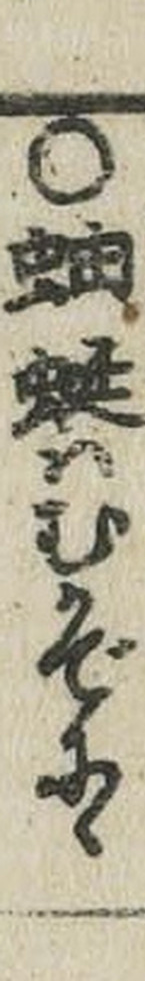○蚰蜓はむかでにゝ
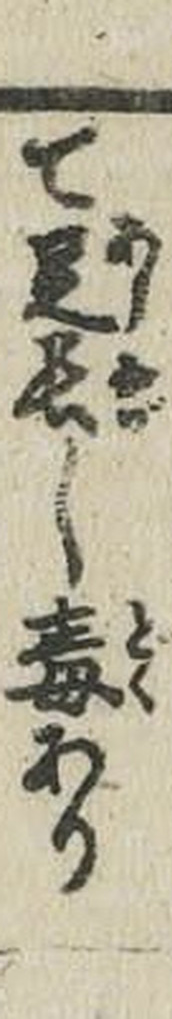て足長し毒あり
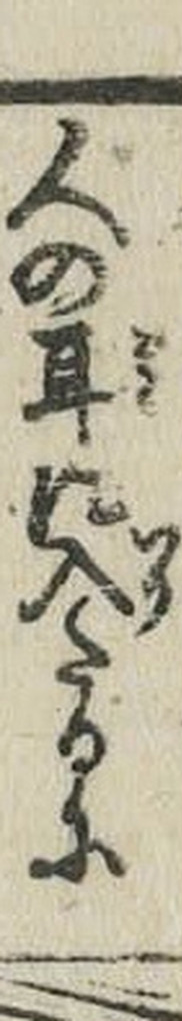人の耳に入たるに
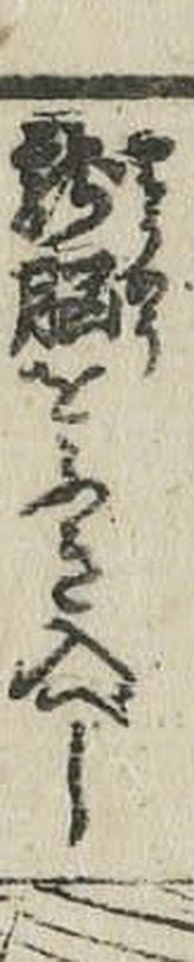龍脳をふき入べし
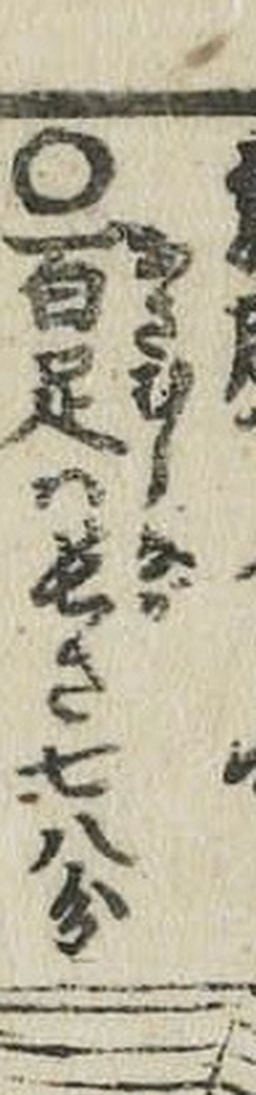○百足は長さ七八分
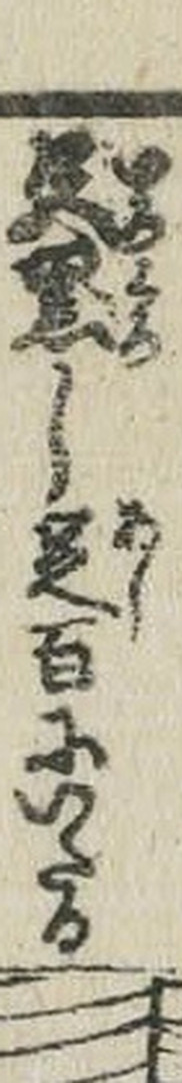色黒し足百にいたる
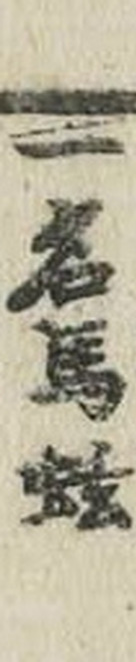一名馬蚿
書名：増補頭書訓蒙図彙大成 10巻 7:巻之14-16
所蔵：東京学芸大学教育コンテンツアーカイブ
